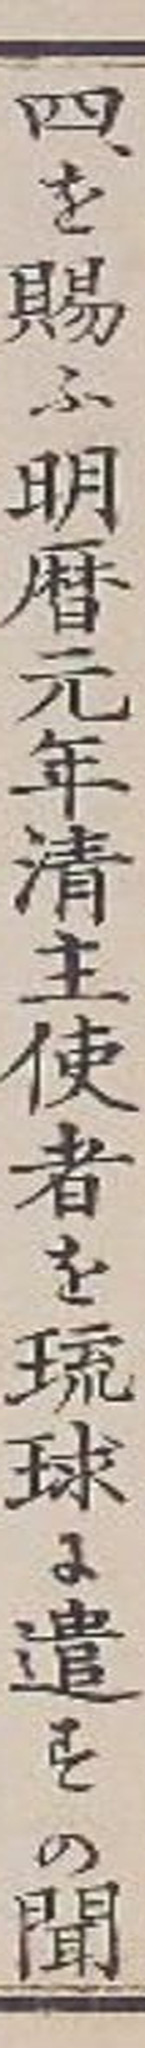四、を賜ふ明暦元年清主使者を琉球に遣すの聞
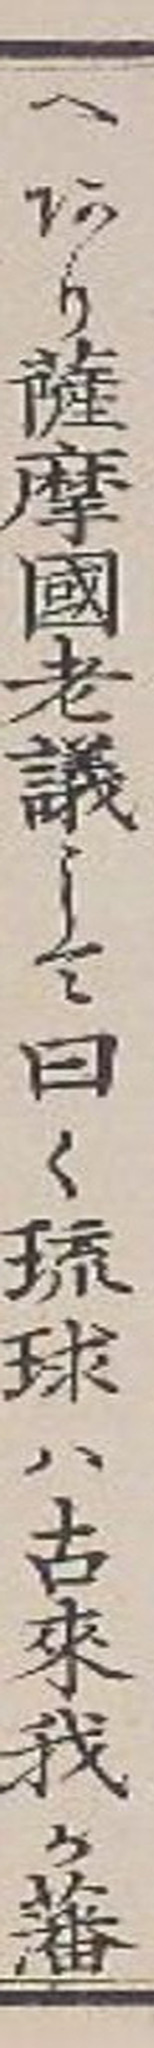へあり薩摩国老議して曰く琉球は古来我か藩
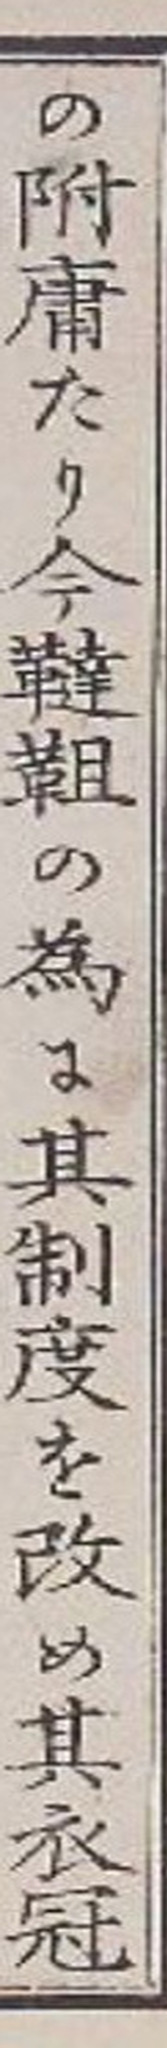の付庸たり今韃靼の為に其制度を改め其衣冠
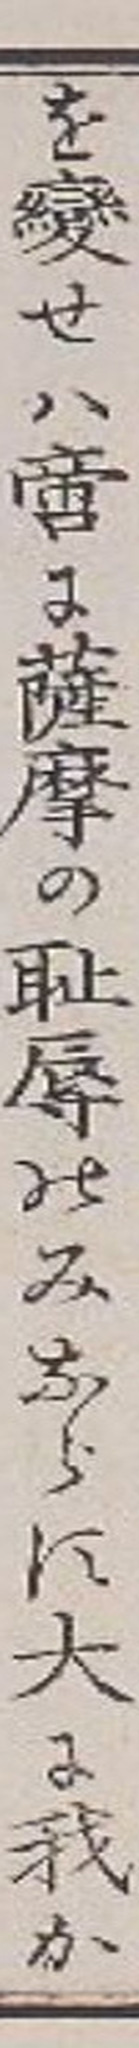を変せは帝に薩摩の恥辱のみならす大に我か
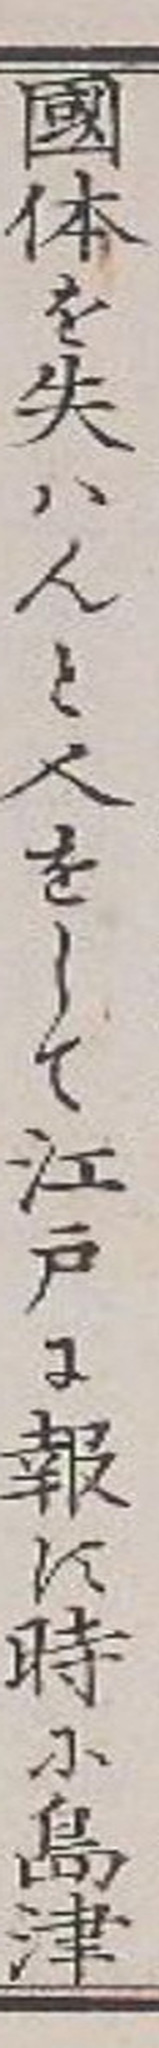国体を失はんと人をして江戸に報す時に島津
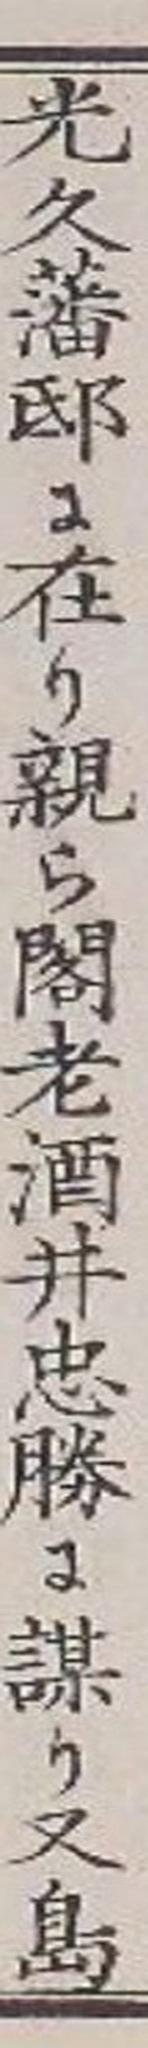光久藩邸に在り親ら閣老酒井忠勝に謀り又島
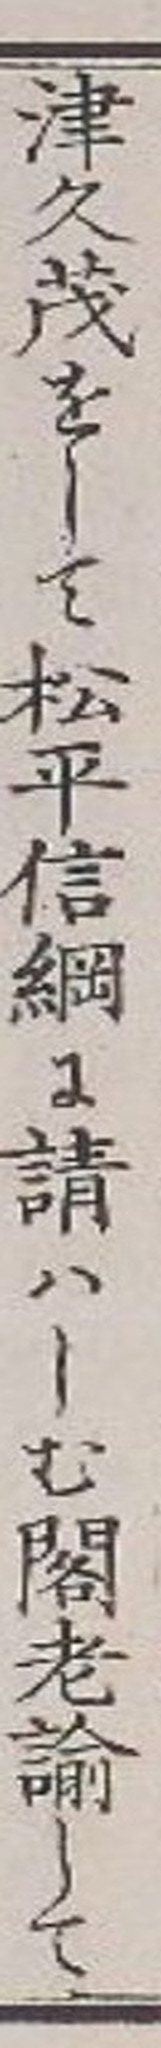津久茂をして松平信綱に請はしむ閣老諭して
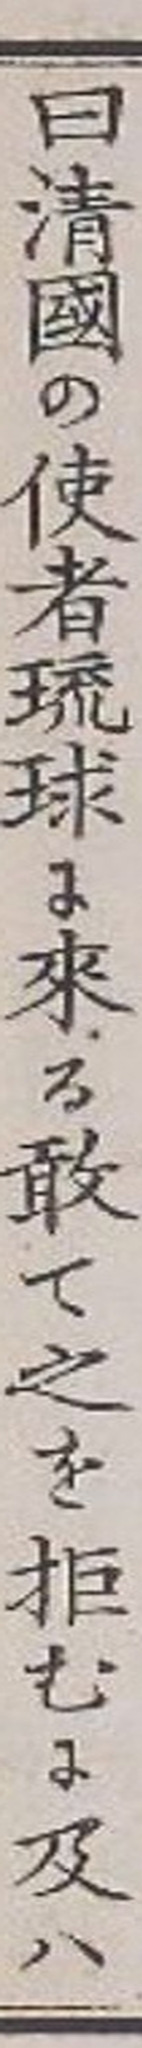曰清国の使者琉球に来る敢て之を拒むに及は
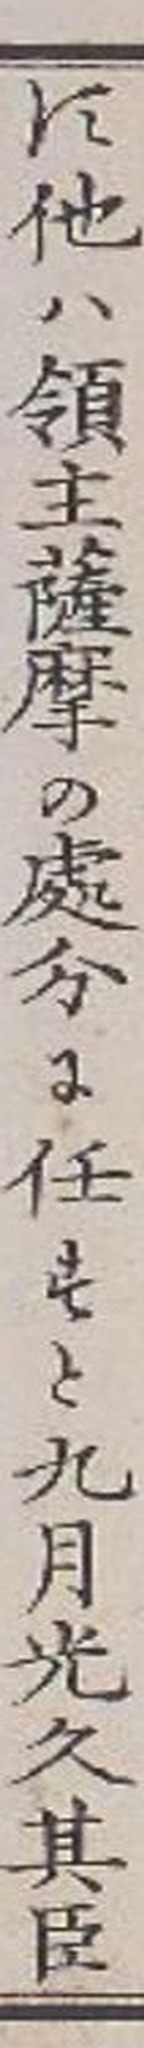す他は領主薩摩の処分に任すと九月光久其臣
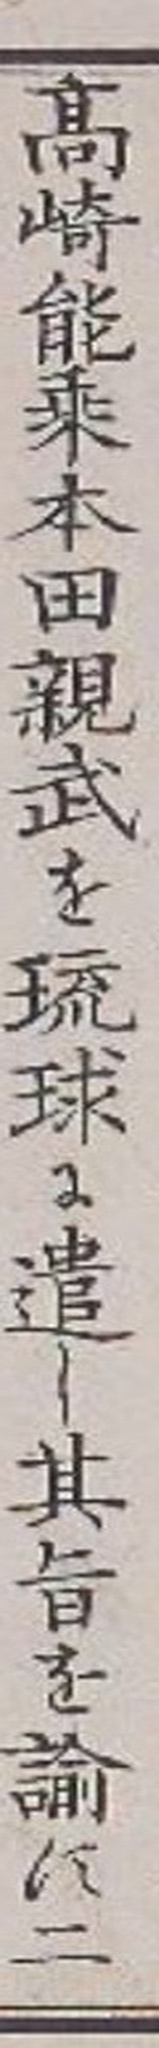高崎能乗本多親武を琉球に遣し其旨を諭す二
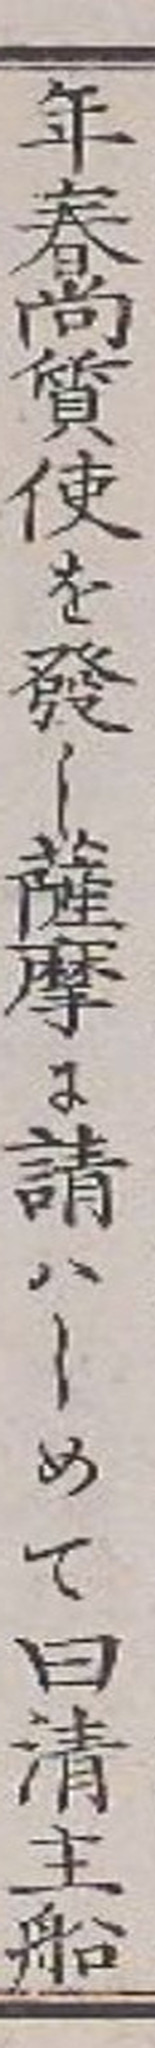年春尚質使を発し薩摩に請はしめて曰清主船
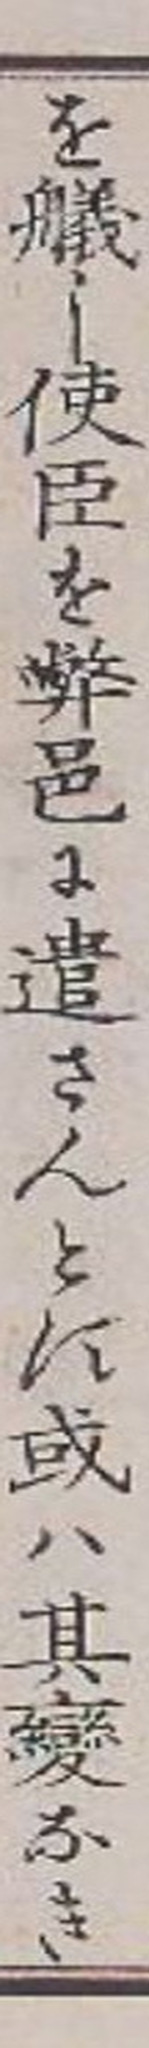を艤し使臣を弊邑に遣さんとす或は其変なき

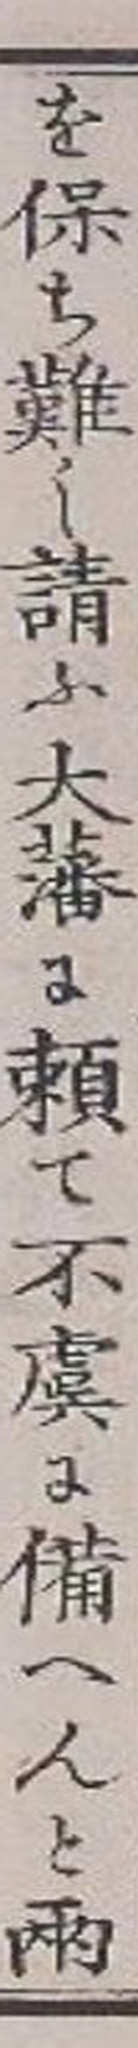を保ち難し請ふ大藩に頼て不慮に備へんと両
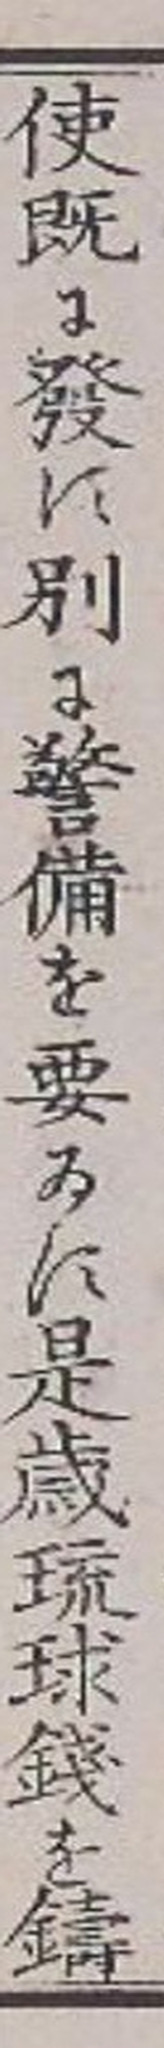使既に発す別に警備を要ゐす是歳琉球銭を鋳
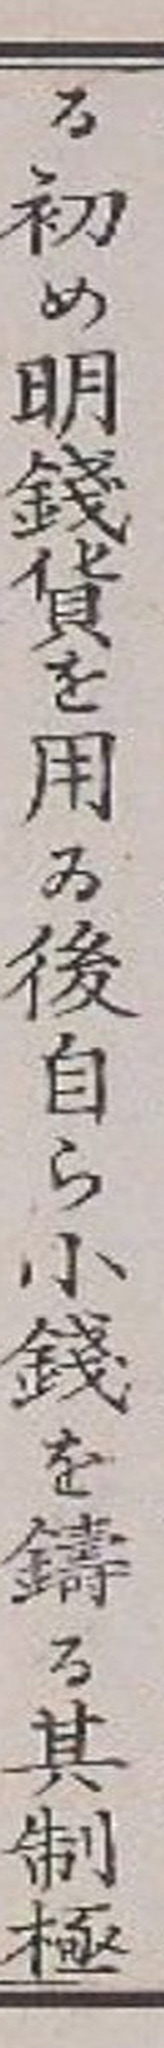る初め明銭貨を用ゐ後自ら小銭を鋳る其制極
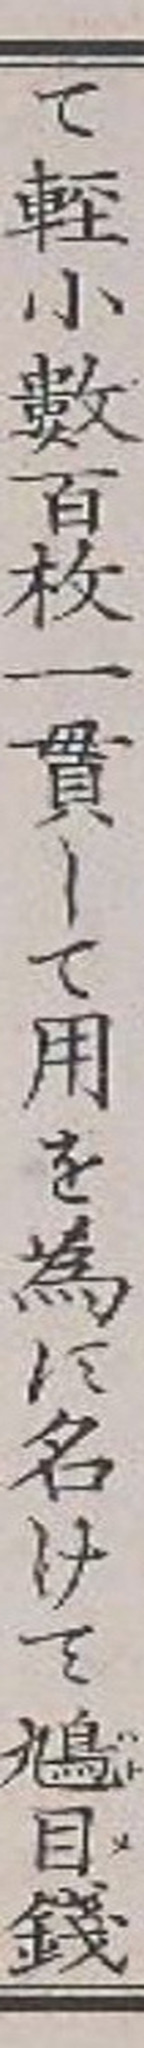て軽少数百枚一貫して用を為す名けて鳩目銭
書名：南島紀事 下
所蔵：University of the Ryukyus Library
